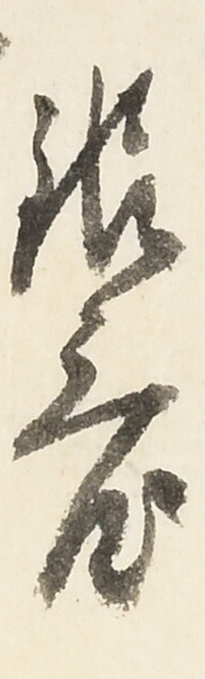銀三匁
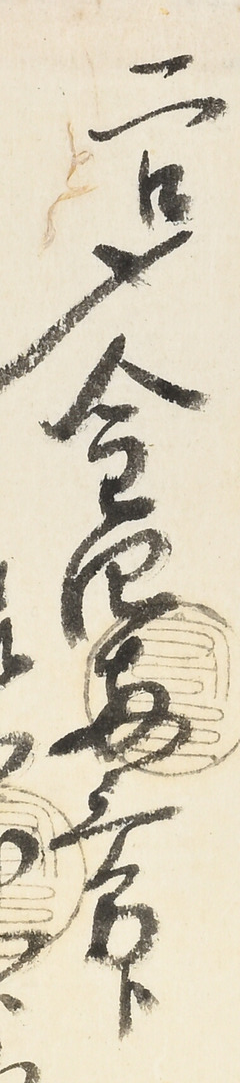二口〆金四両三分ト
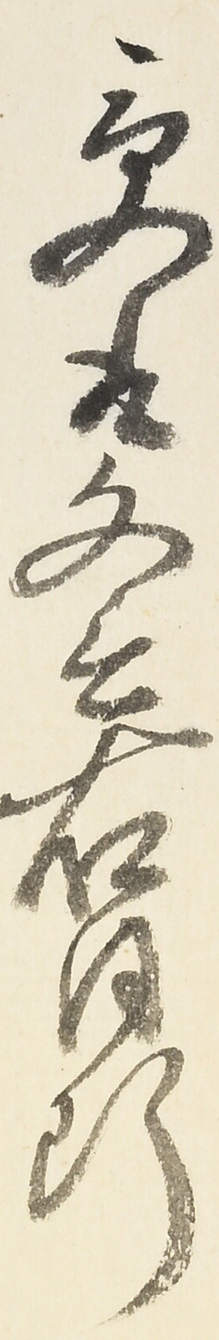受取文言右同断
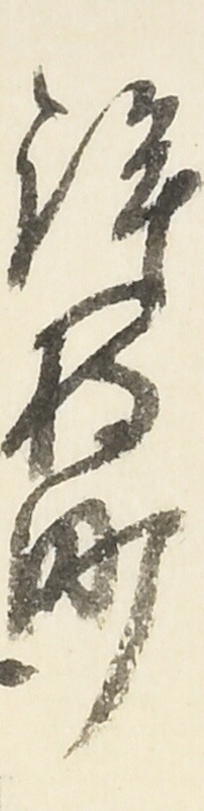鉾持町
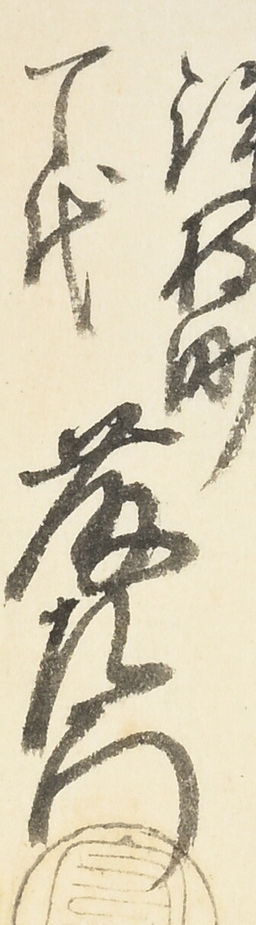酉丁代藤左衛門
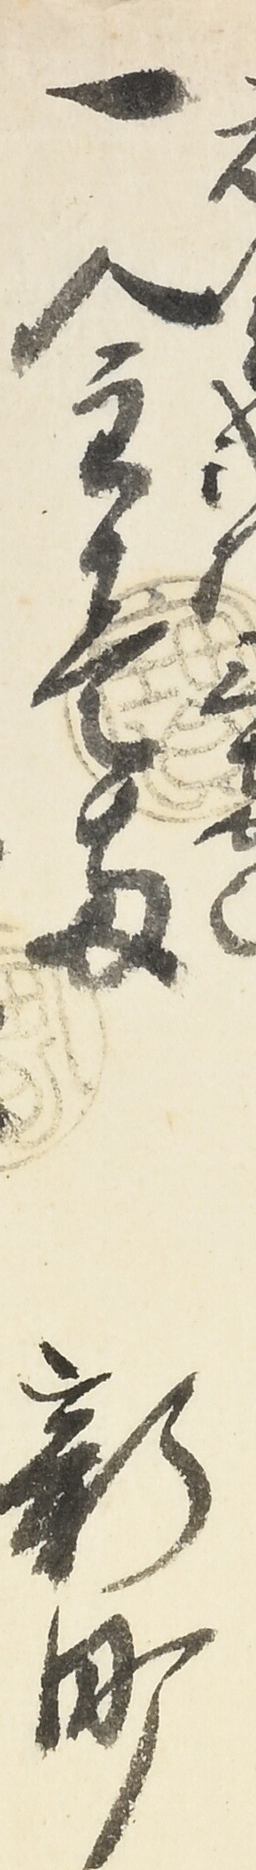一金壱両新町
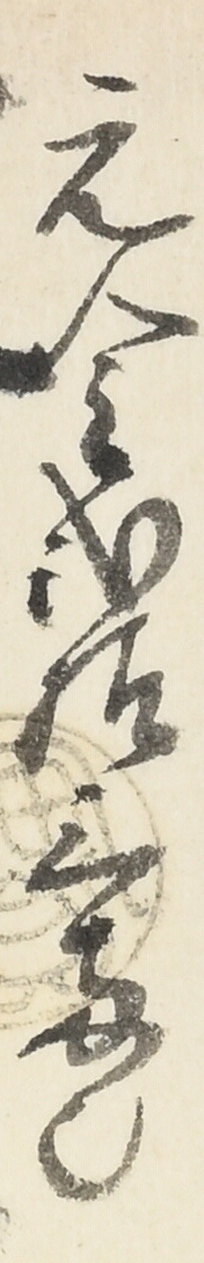元金弐拾三両也
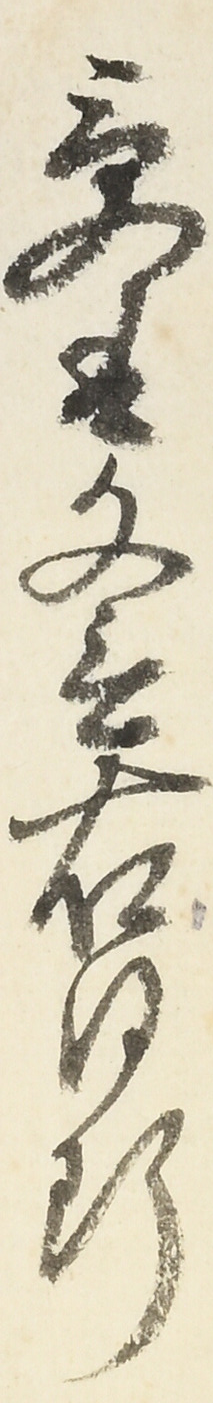受取文言右同断
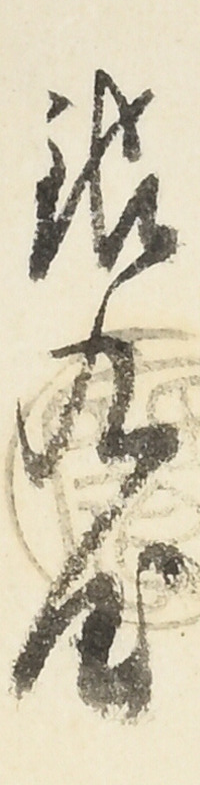銀九匁

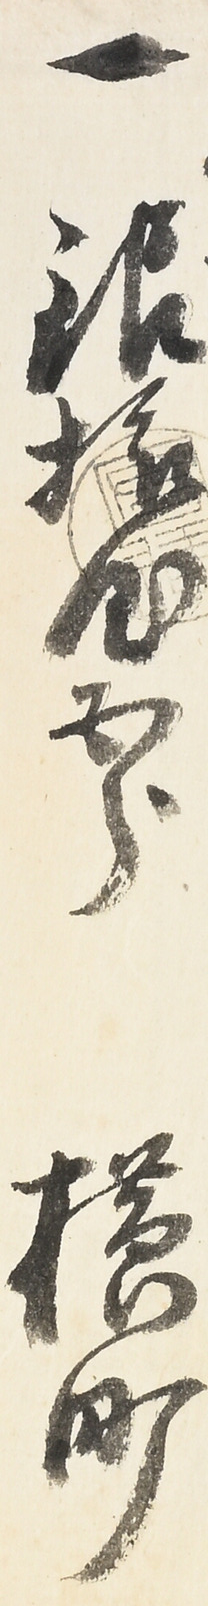一銀拾匁五分横町
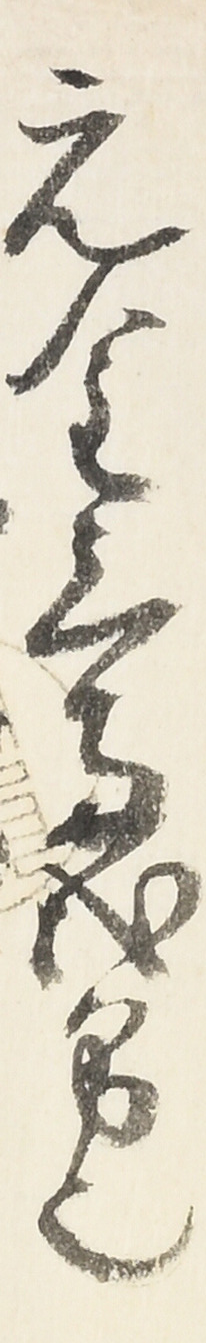元金三両弐分也
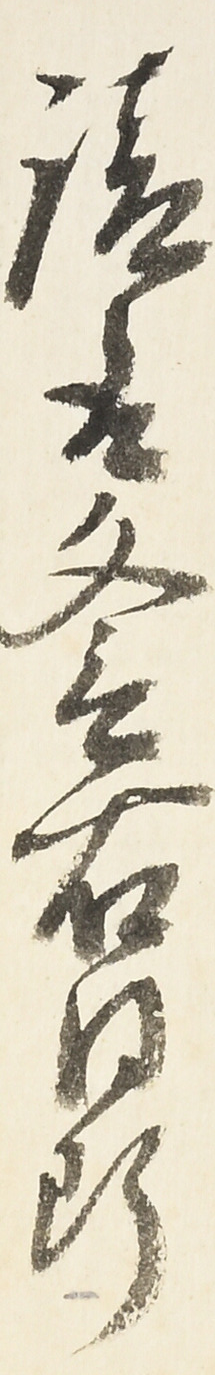請取文言右同断
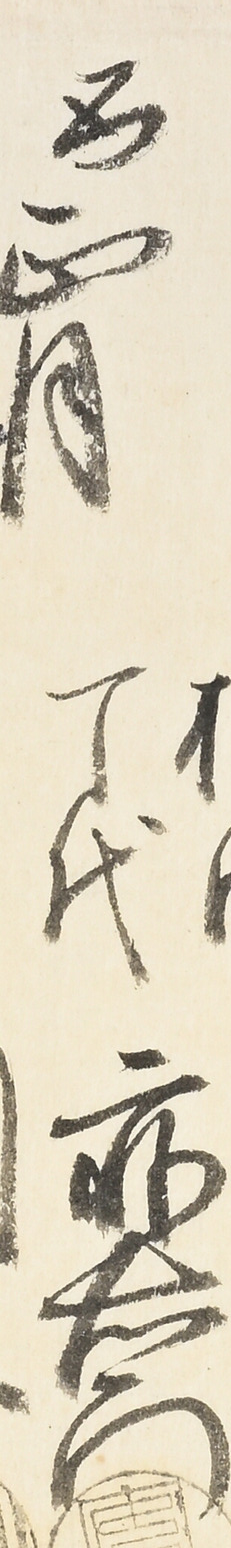酉正月同断十右衛門
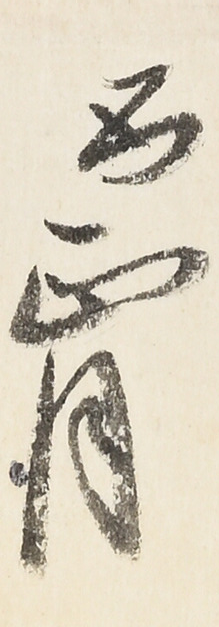酉正月
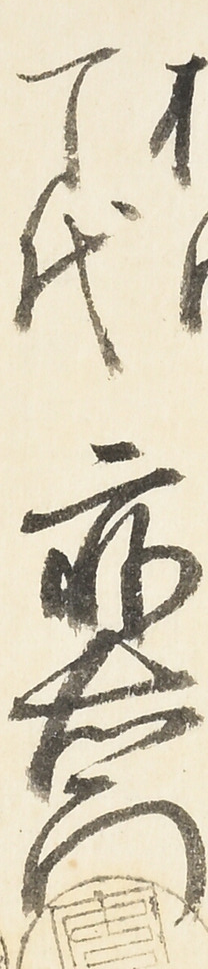丁代亦右衛門
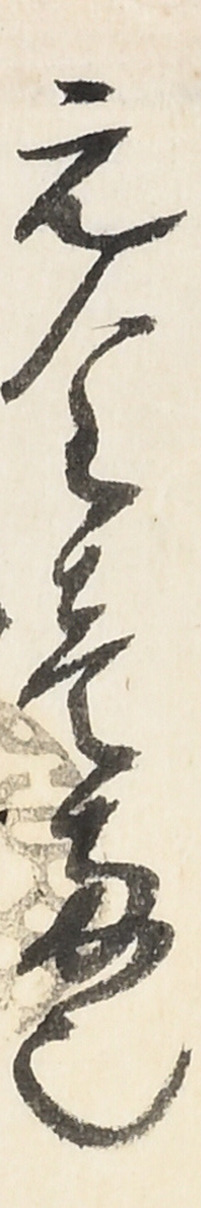元金壱両也
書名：御才覚金御利足割渡扣帳
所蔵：伊那市立高遠町図書館・合同会社AMANE
